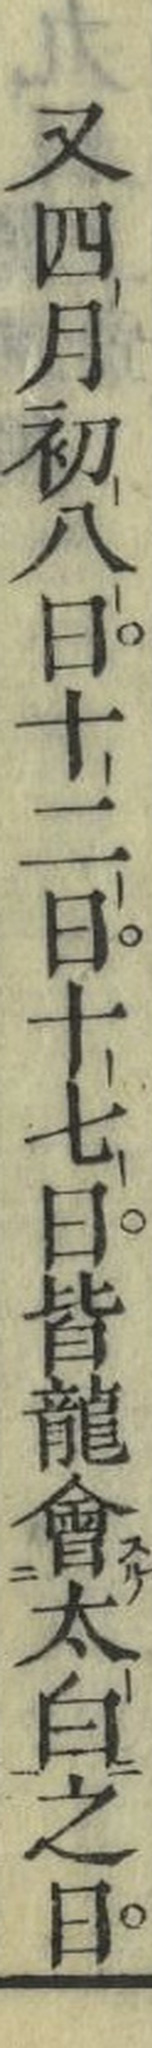又四-月初-八-日。十-二-日。十-七-日。皆龍會太-白之日。
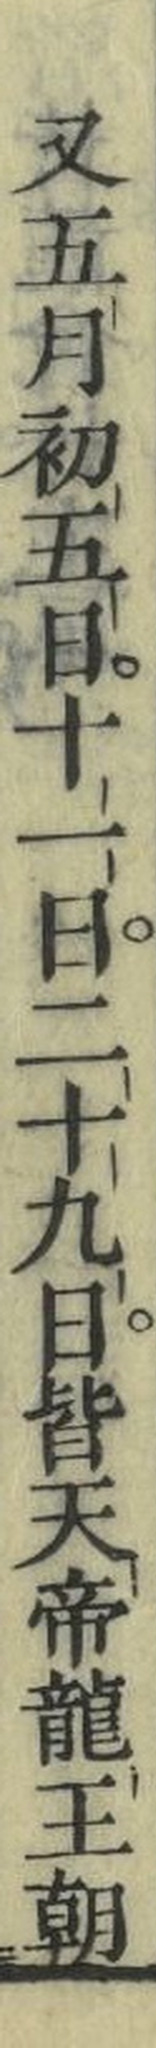又五-月初-五-日。十-一-日。二-十-九-日。皆天-帝龍-王朝
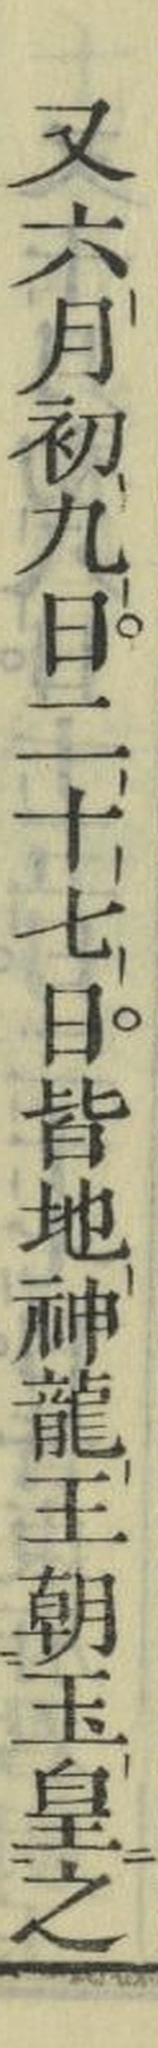又六-月初-九-日。二-十-七-日。皆地-神龍-王朝玉-皇之
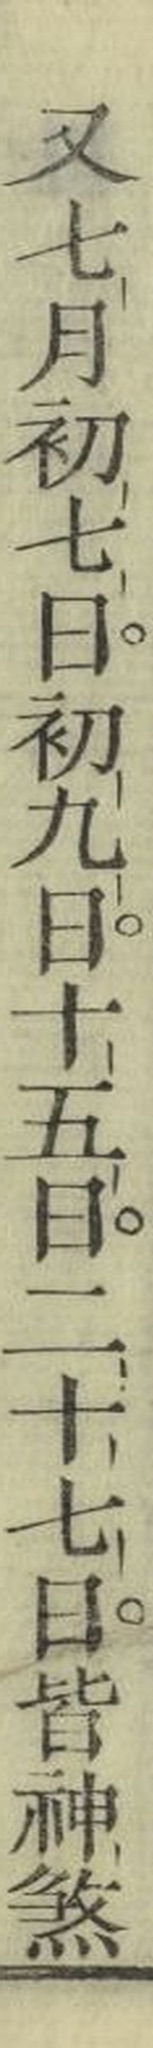又七-月初-七-日。初-九-日。十-五-日。二-十-七-日。皆神-煞
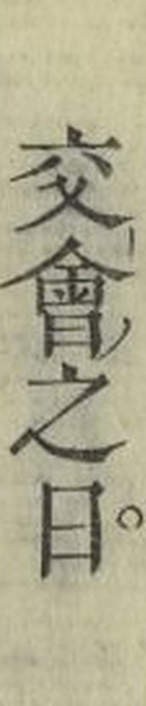交-會之日。
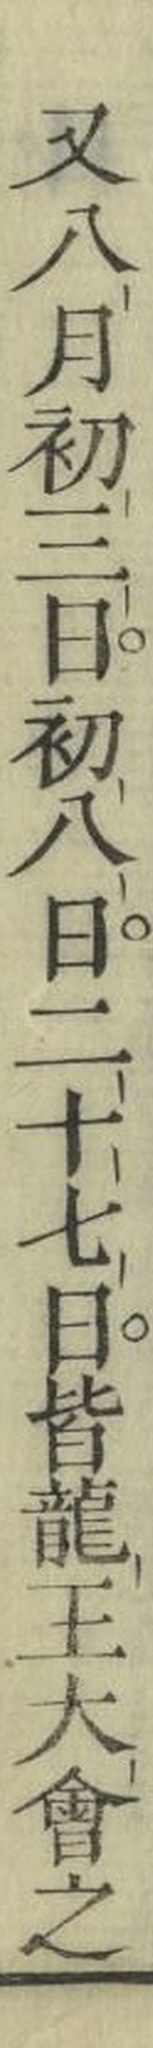又八-月初-三-日。初-八-日。二-十-七-日。皆龍-王大-會之

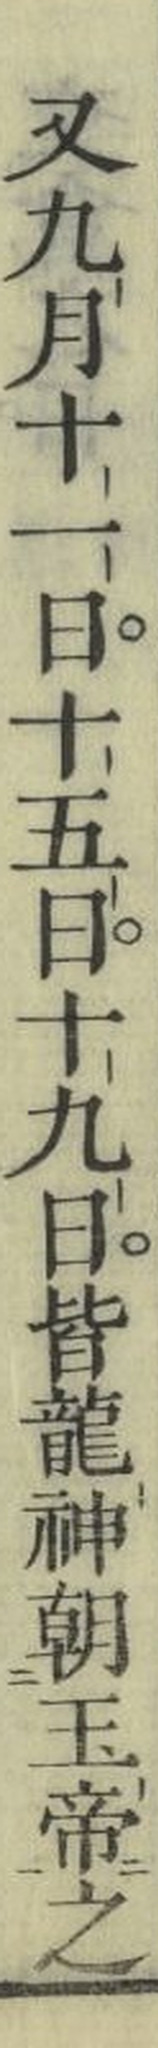又九-月十-一-日。十-五-日。十-九-日。皆龍-神朝玉-帝之
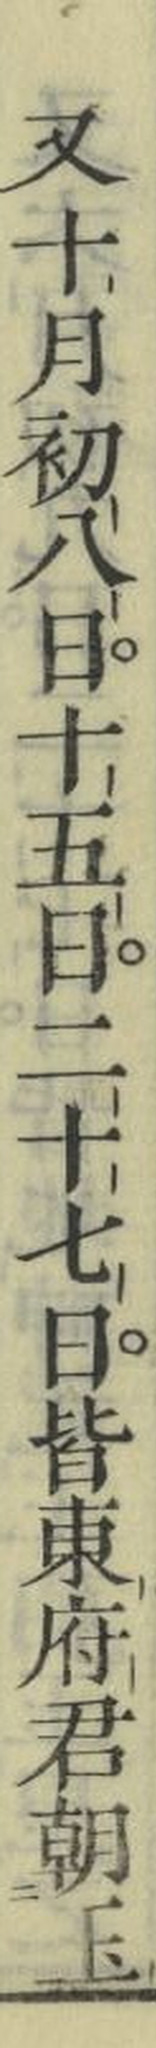又十-月初-八-日。十-五-日。二-十-七-日。皆東-府-君朝玉-

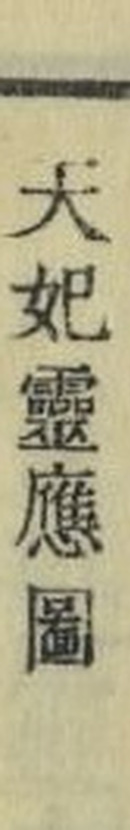天妃靈應圖

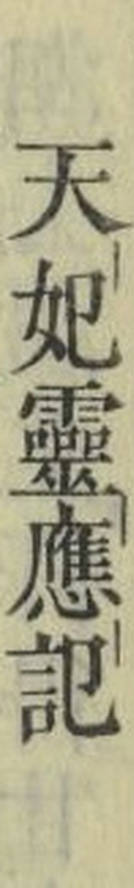天-妃靈-應-記

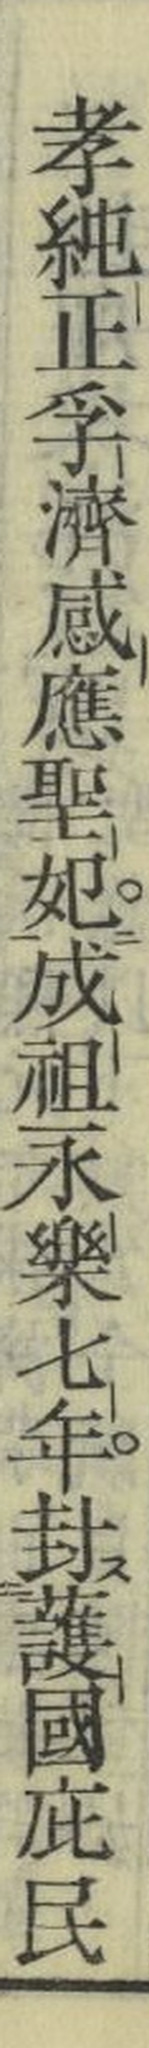孝純-正孚-濟感-應聖-妃。成-祖永-樂七-年。封䕶-國庇-民

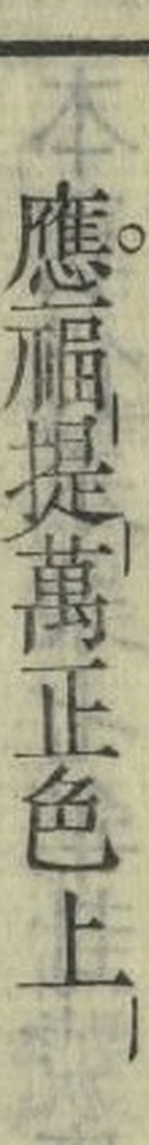應。福-提-萬正色上-
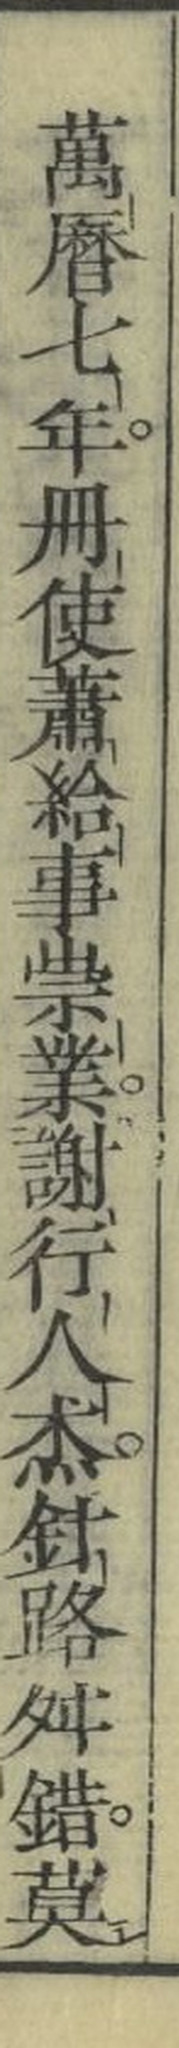萬-曆七-年。冊-使蕭-給-事崇-業。謝-行-人-然。針-路舛-錯。莫

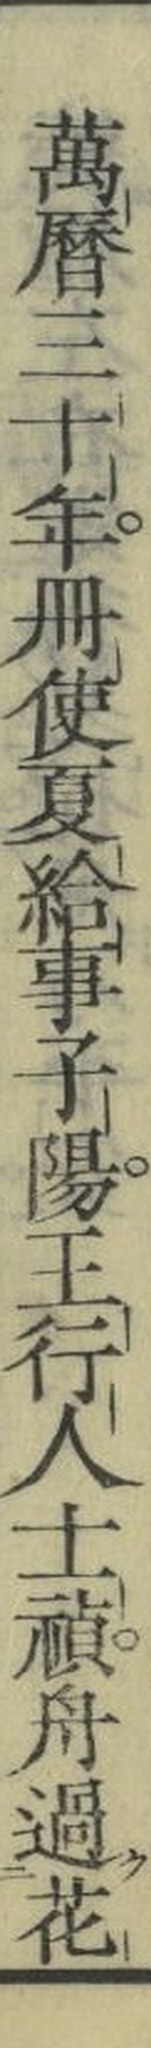萬-曆三-十-年。冊-使夏-給-事子-陽。王-行-人士-禎。舟過花-
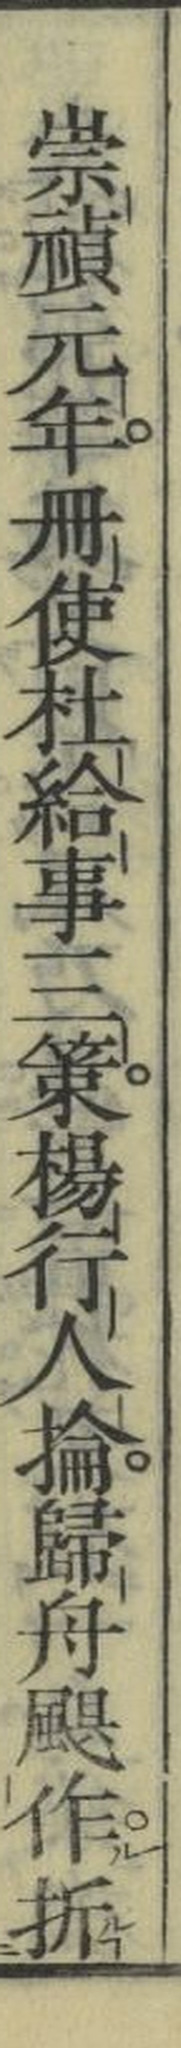崇-禎元-年。冊-使杜-給-事三-策。楊-行-人-掄。歸-舟颶-作。折ヿ
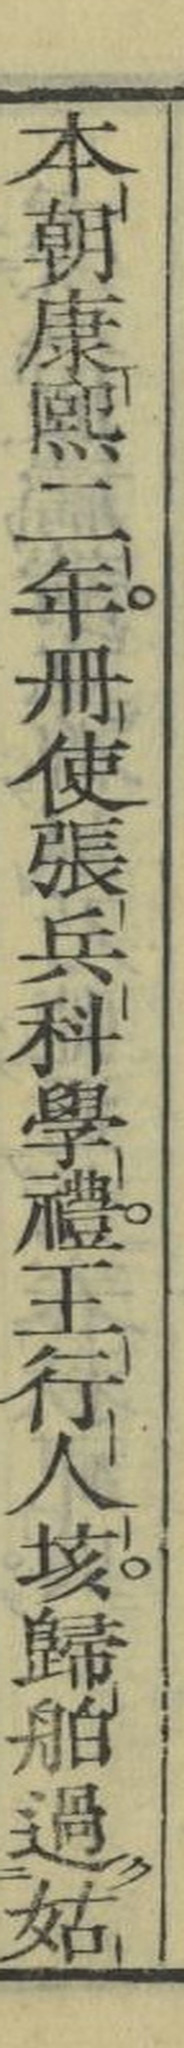本-朝康-熙二-年。冊-使張-兵-科學-禮。王-行-人-垓。歸-舶過姑-
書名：中山伝信録 巻一
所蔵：University of the Ryukyus Library
